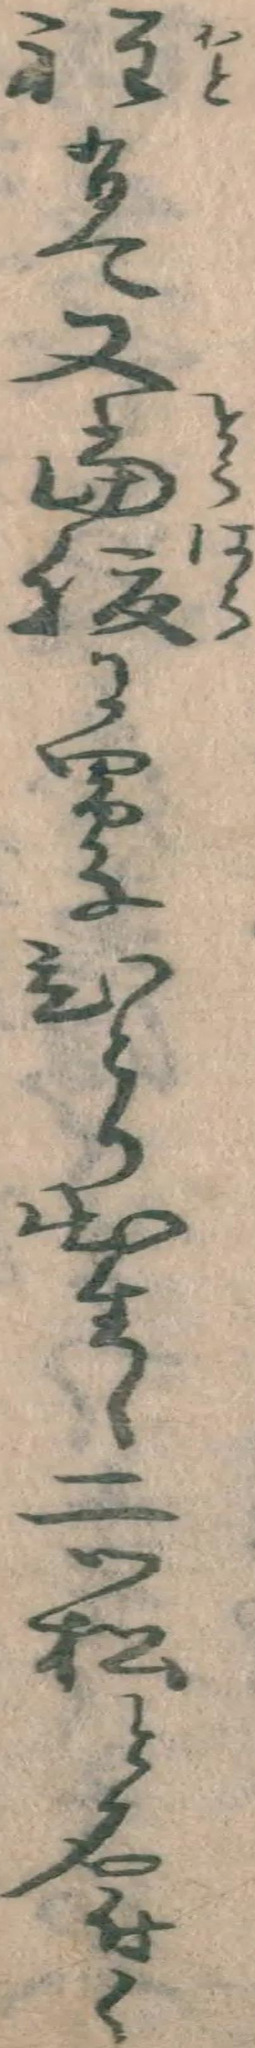程有て又当腹に男子ひとり出生し二つ松と名付く
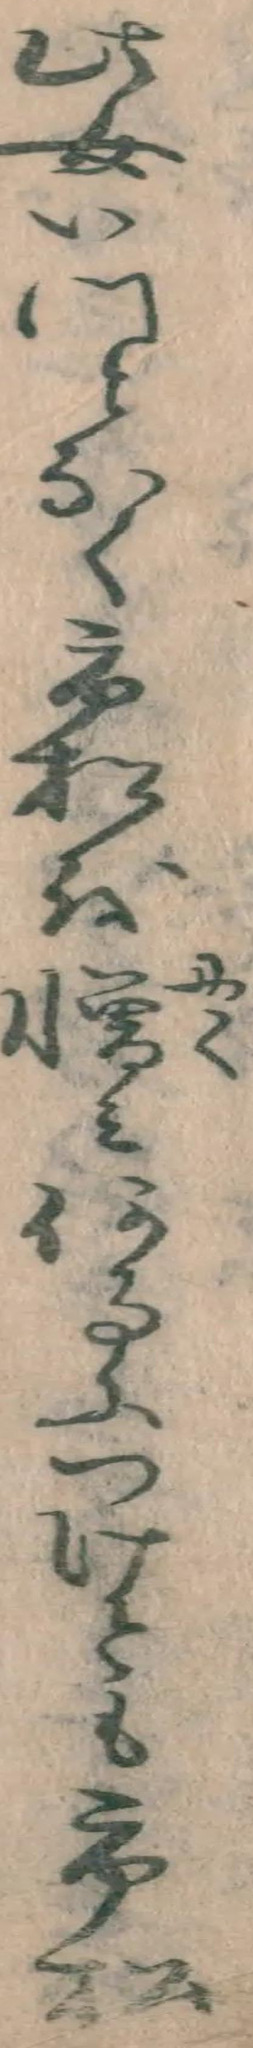此女いつとなく市松を憎み何事につけても市松
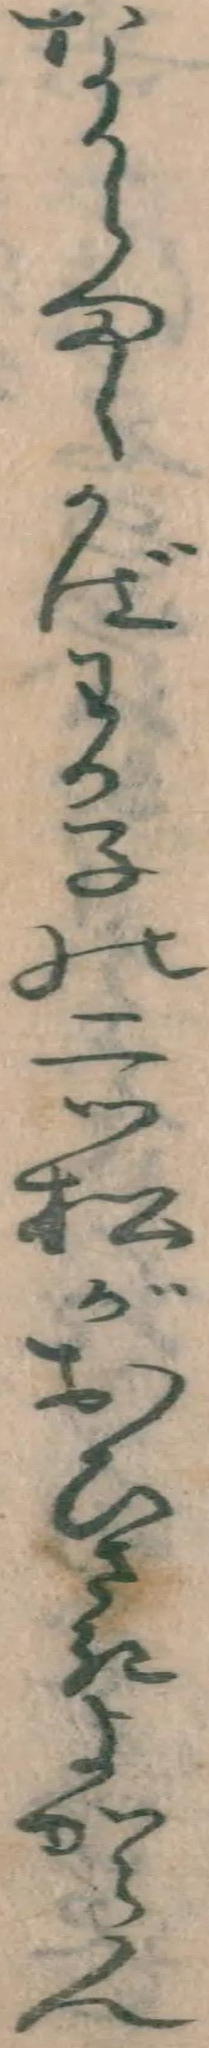なからましかばわか子の二つ松がおひさきよからん
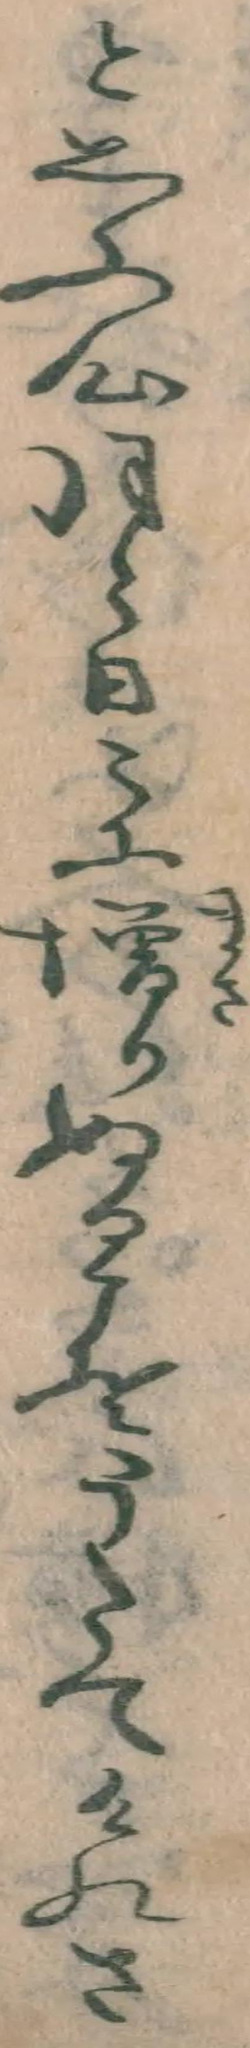とおもふ心月々日々に増りぬるこそうたてけれさ
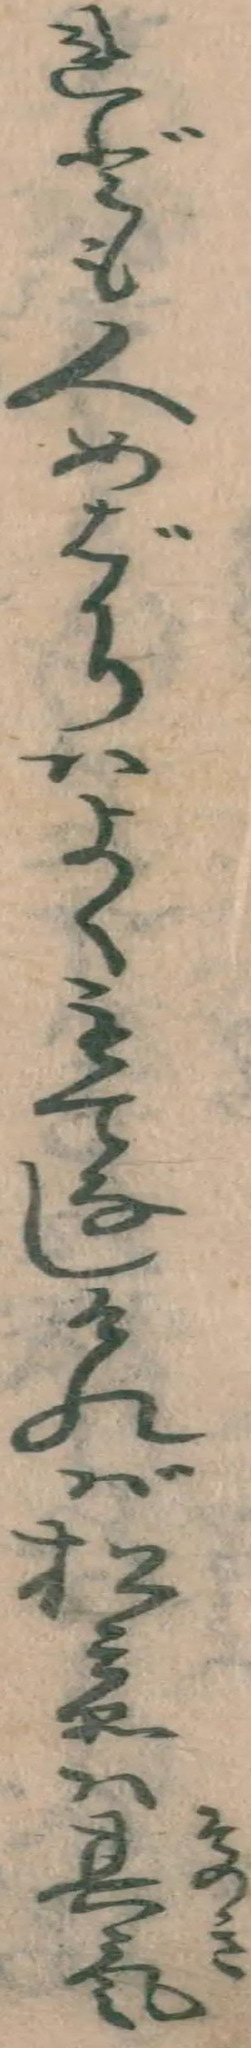れども人めばかりはよくもてなしければ松兵衛は其気
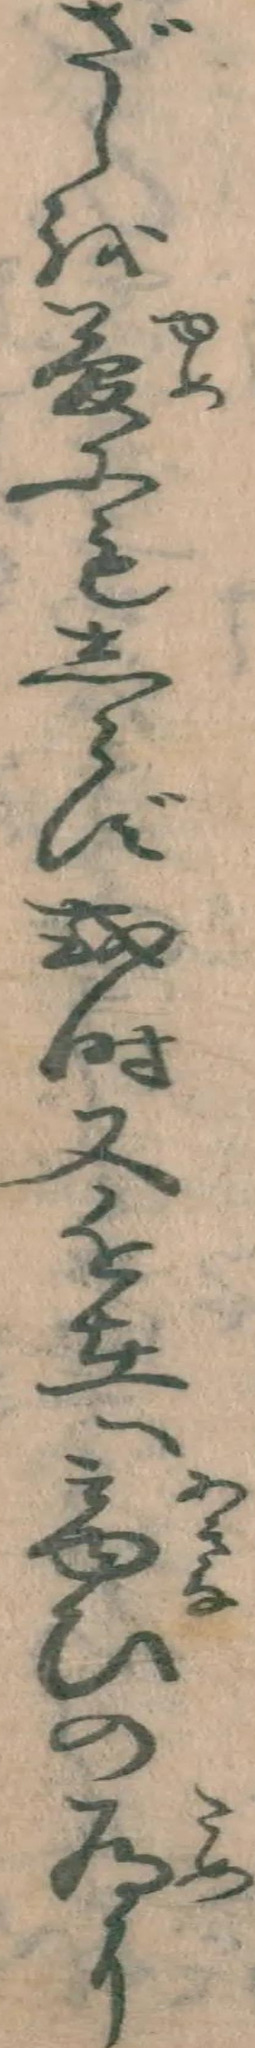ざしを夢にもしらず或時又近在へ商ひの為に
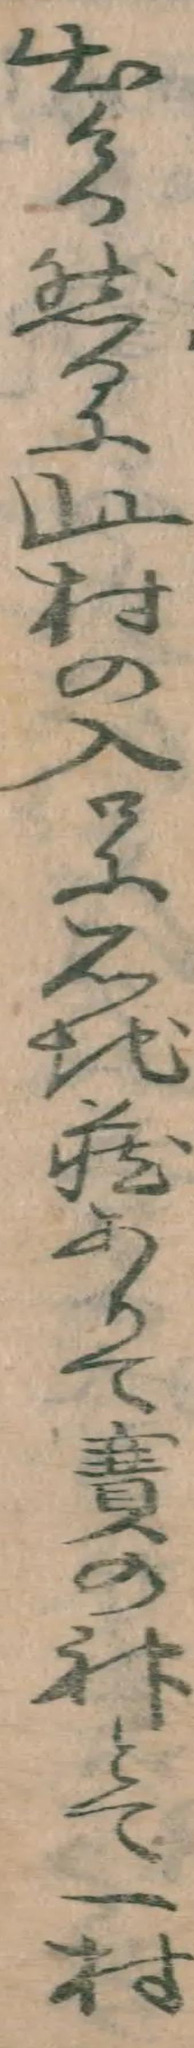出ける然るに此村の入口に石地蔵ありて賽の神とて一村
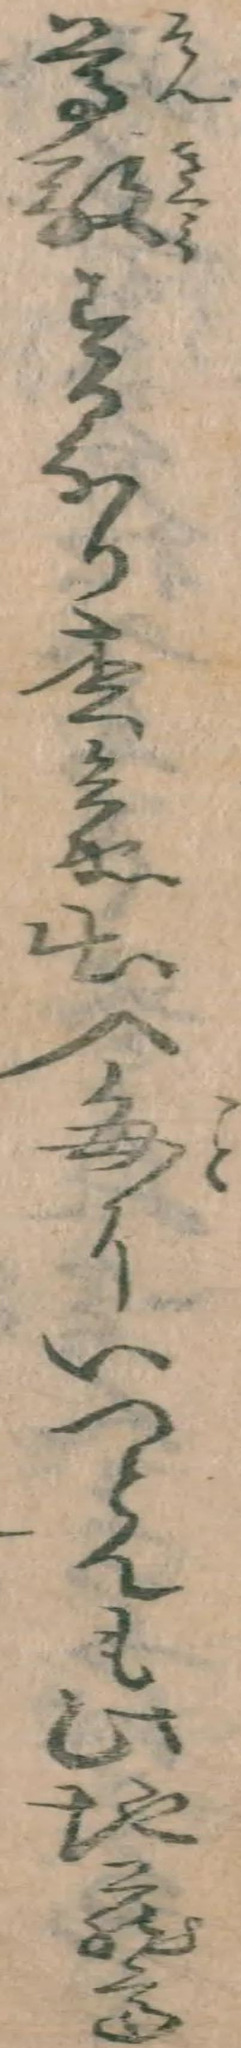尊敬するなり松兵衛出入毎にいつとても此地蔵尊
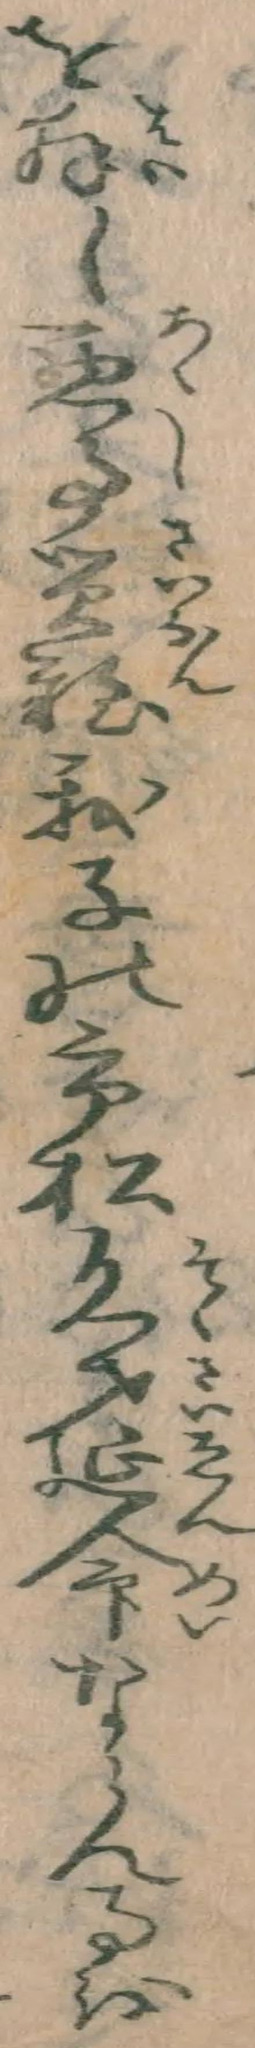を拝し悪事災難我子の市松息災延命ならん事を
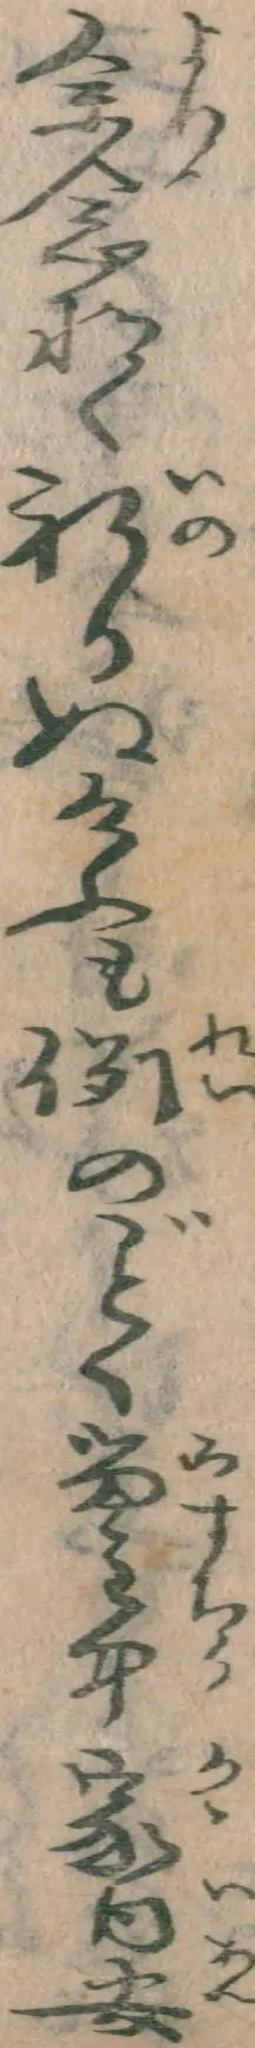余念なく祈りぬけふも例のごとく留主中家内安
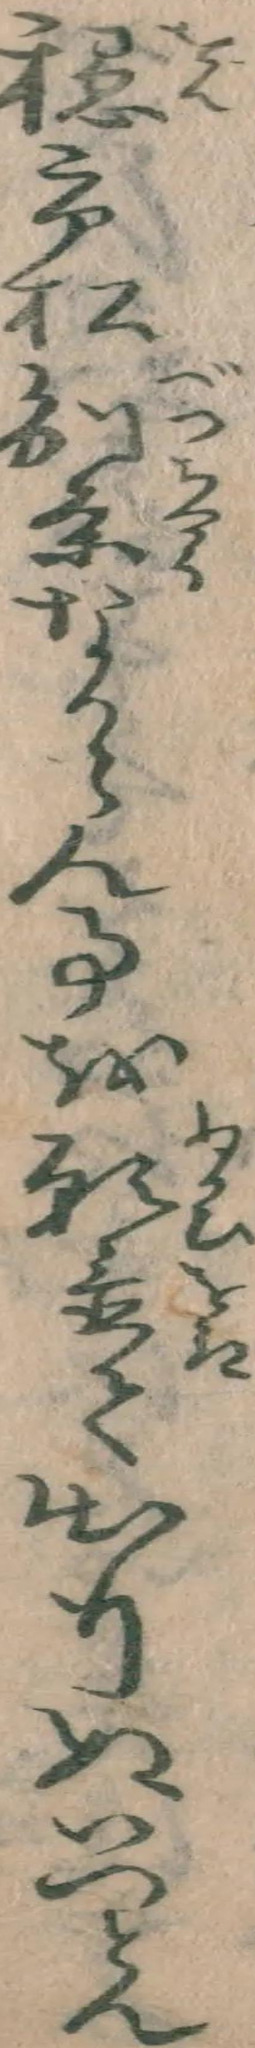穏市松別条なからん事を願置て出行ぬいつとて
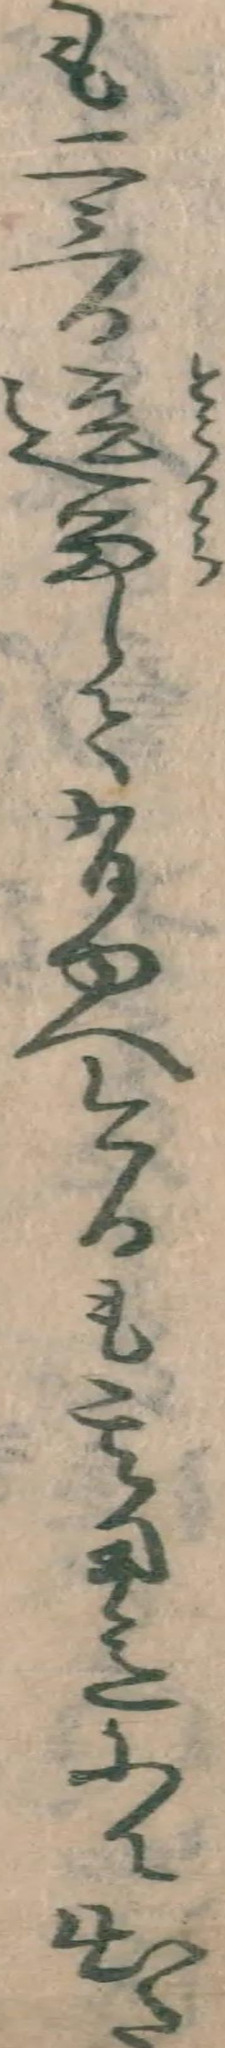も二三日逗留して有ゆへ今日も其用意にて出た
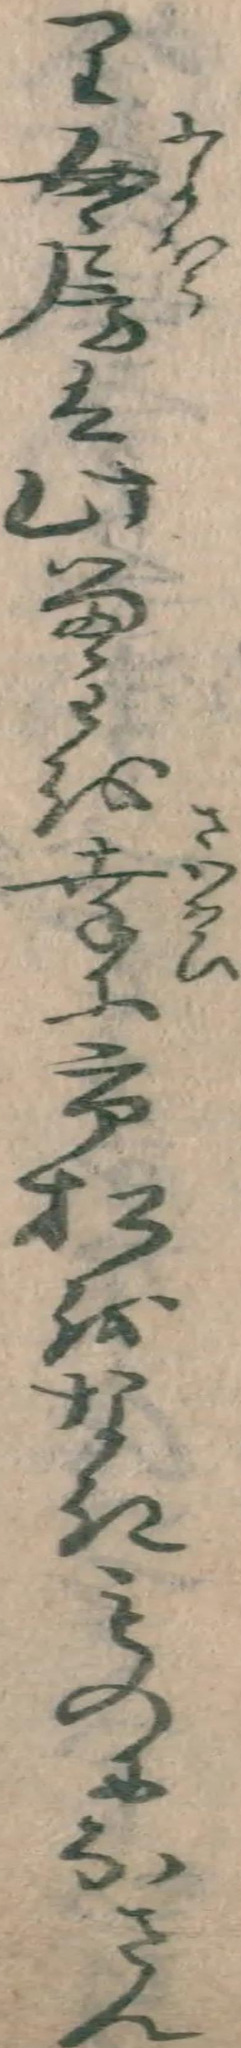り女房は此留主を幸に市松をなきものになさん
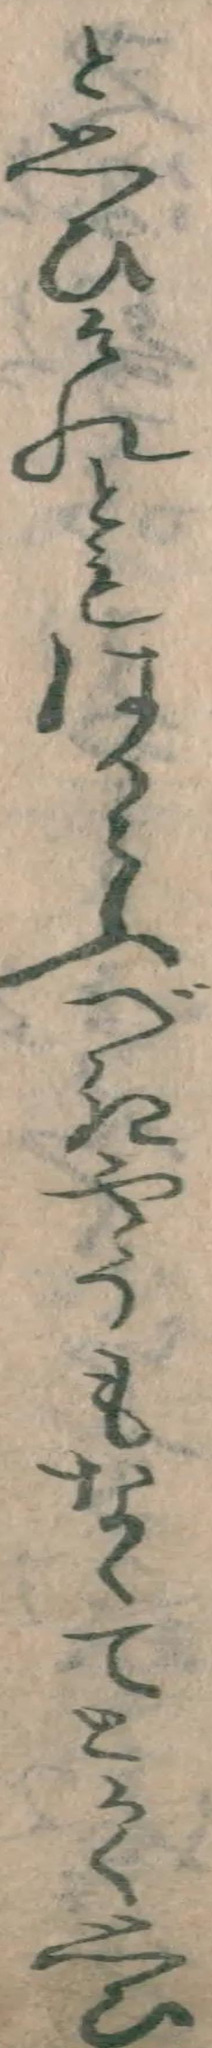と思ひそれともはからふべきやうもなくてとかく思ひ
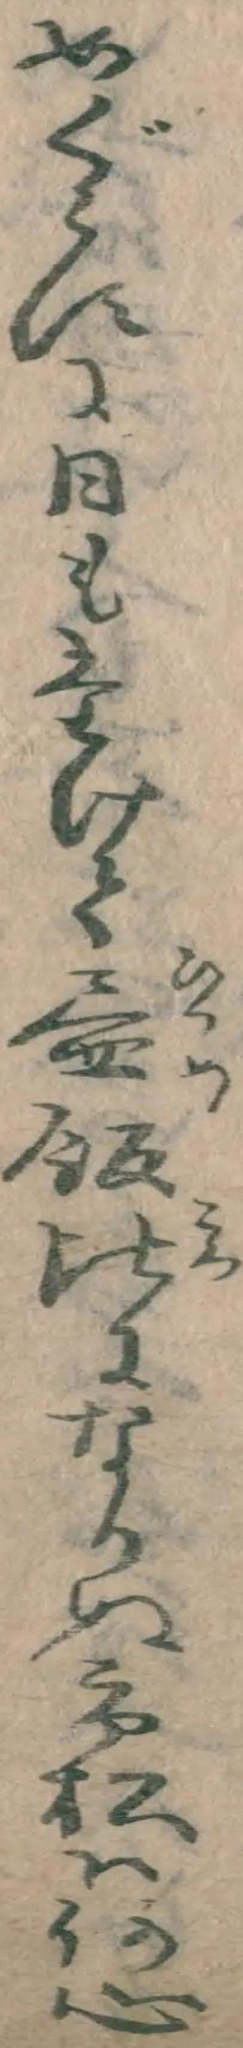めぐらすに日もたけて昼飯頃になりぬ市松は何心
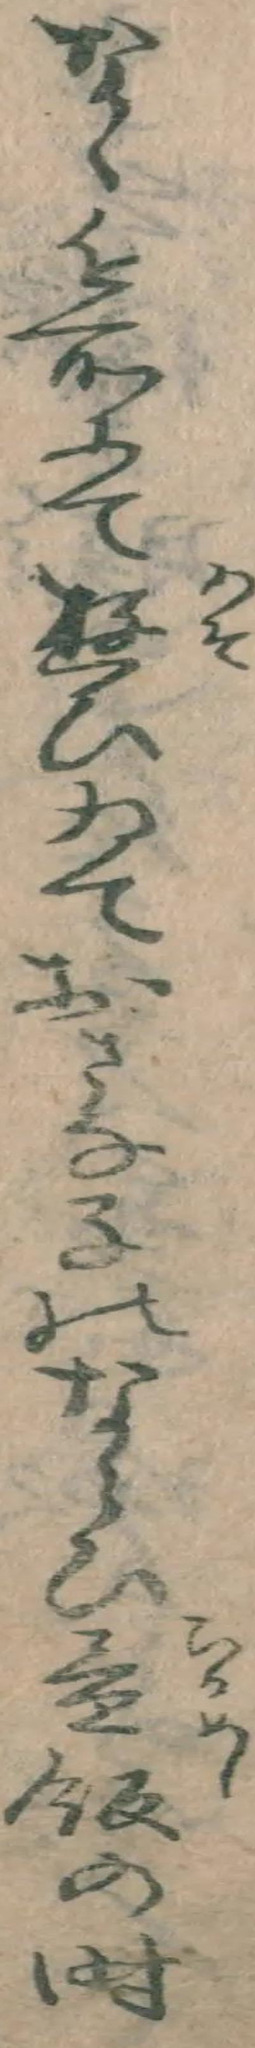なく近所にて遊ひゐておさな子のならひ昼飯の時
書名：怪談御伽童 5巻. [1]
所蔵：国立国会図書館 National Diet Library, JAPAN
